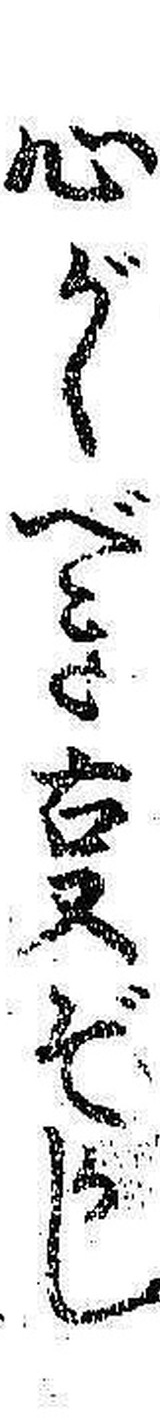心がくべき事ぞかし
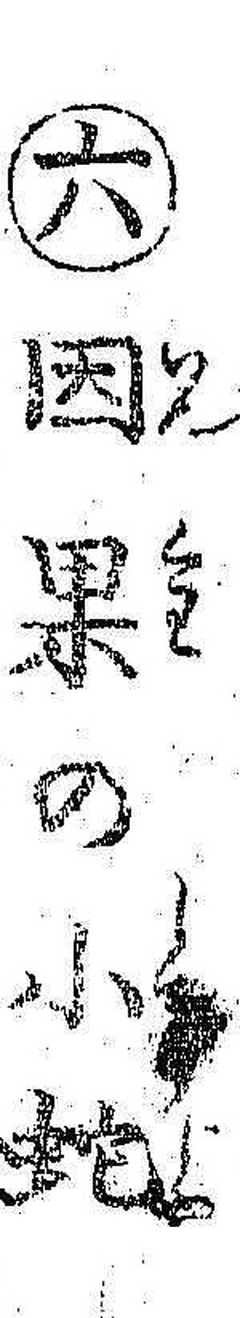六因果の小蛇
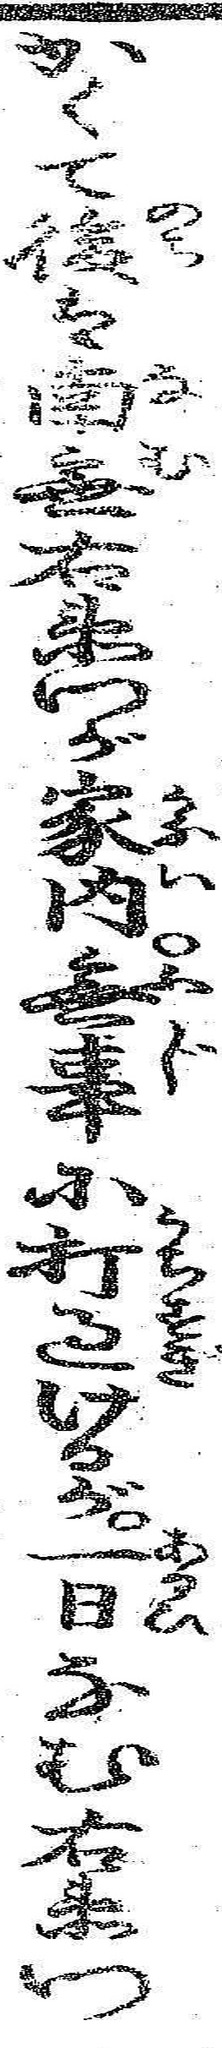かくて後は南無右衛門が家内。無事に打過けるが。一日なむ右衛門
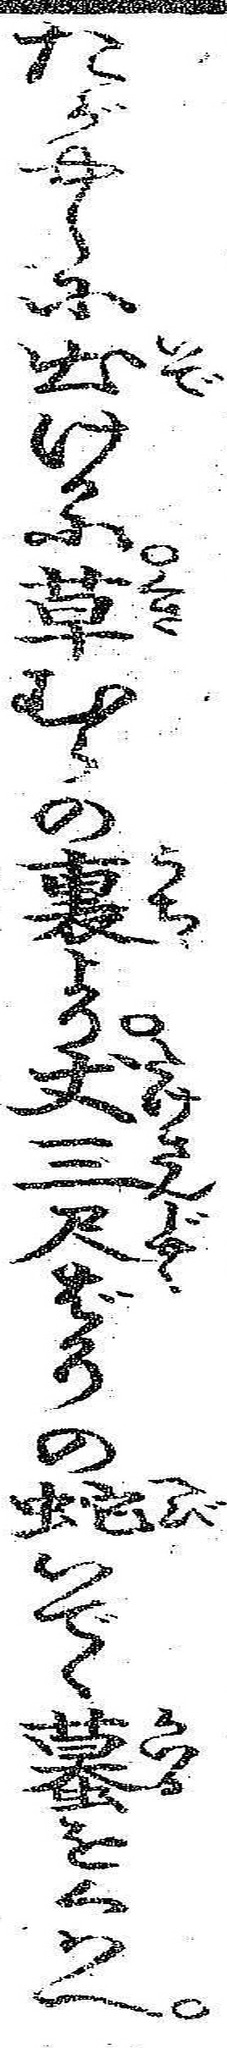たがやしに出けるに。草むらの裏より。丈三尺ばかりの蛇いでゝ蟇をくわへ。
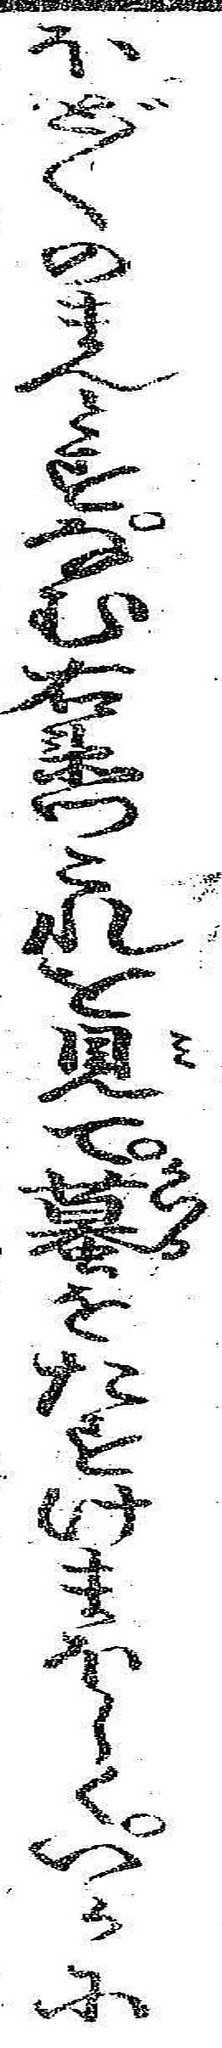ほど〳〵のまんとす。なむ右衛門これを見て。蟇をたすけまほしく。いかに
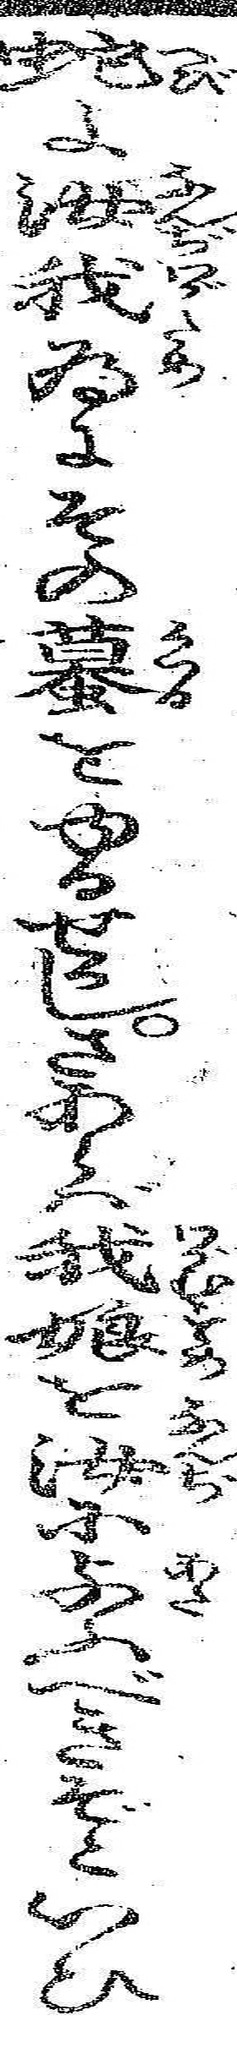蛇よ汝我為にその蟇をゆるせかし。さあらば我娘を汝に与ふべきぞといひ
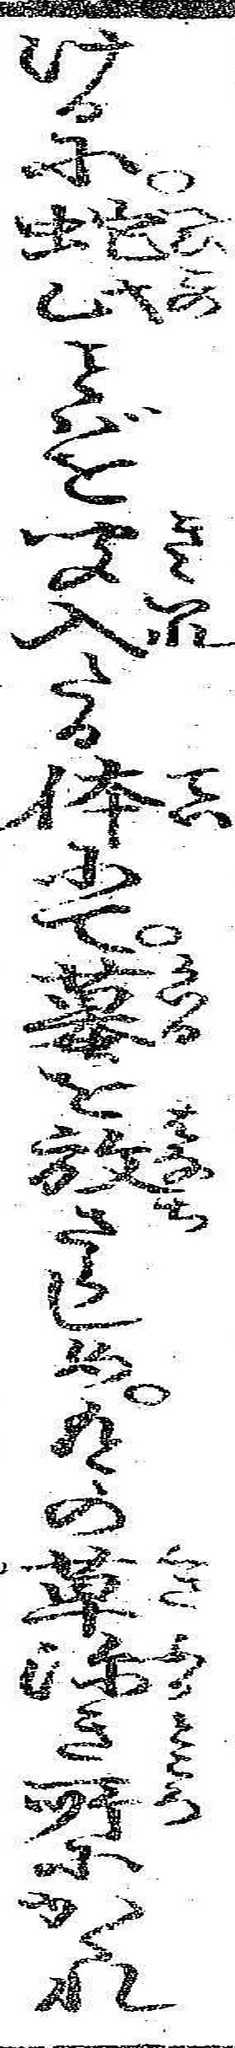けるに。蛇此ことばを聞入たる体にて。蟇を放さらしめ。もとの草深き所にかくれ
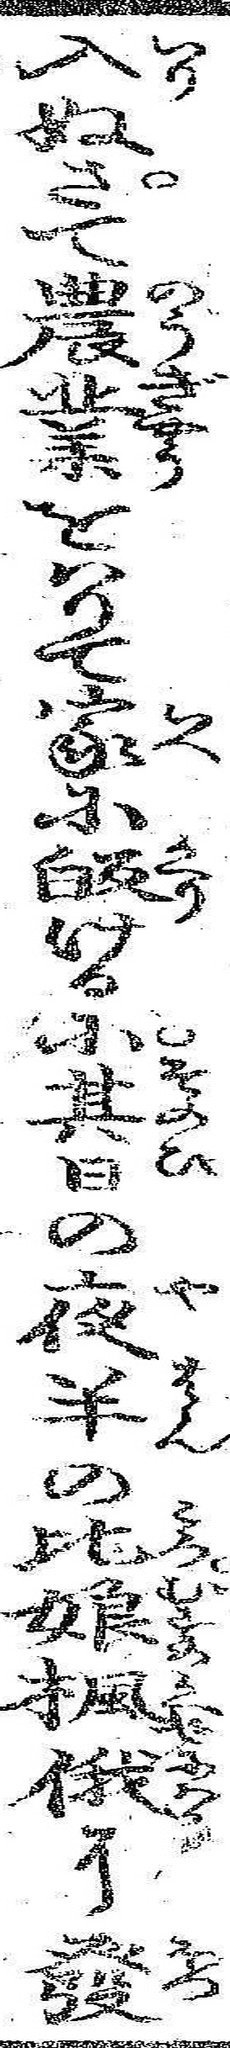入ぬ。さて農業をはりて家に帰けるに。其日の夜半の比。娘楓俄に発
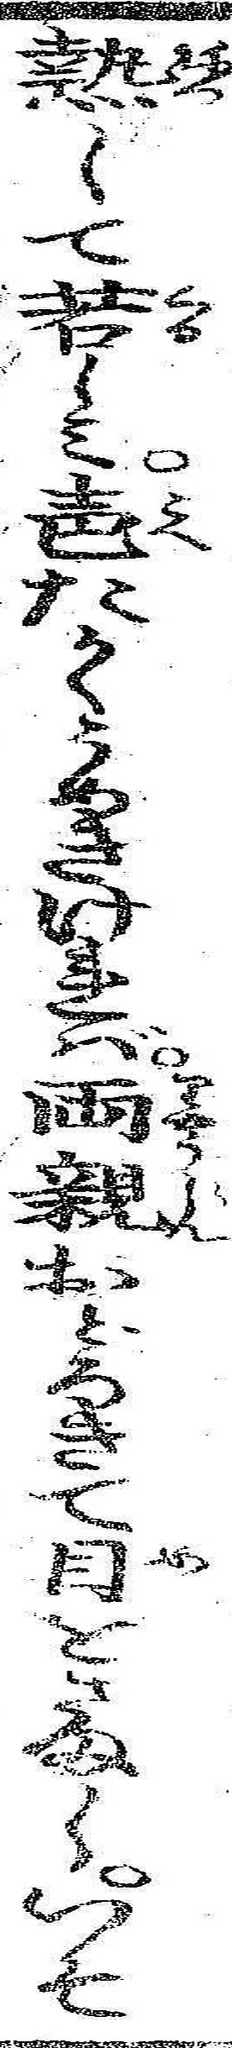熱して苦しみ。声たかくうめきければ。両親おどろきて目をさまし。いそ
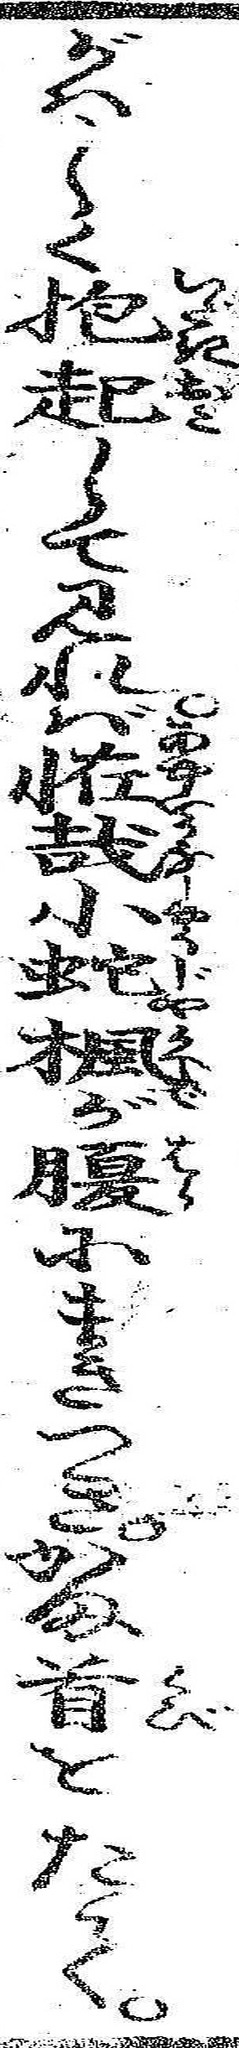がはしく抱起して見れば。恠哉小蛇楓が腹にまきつき。かま首をたて。
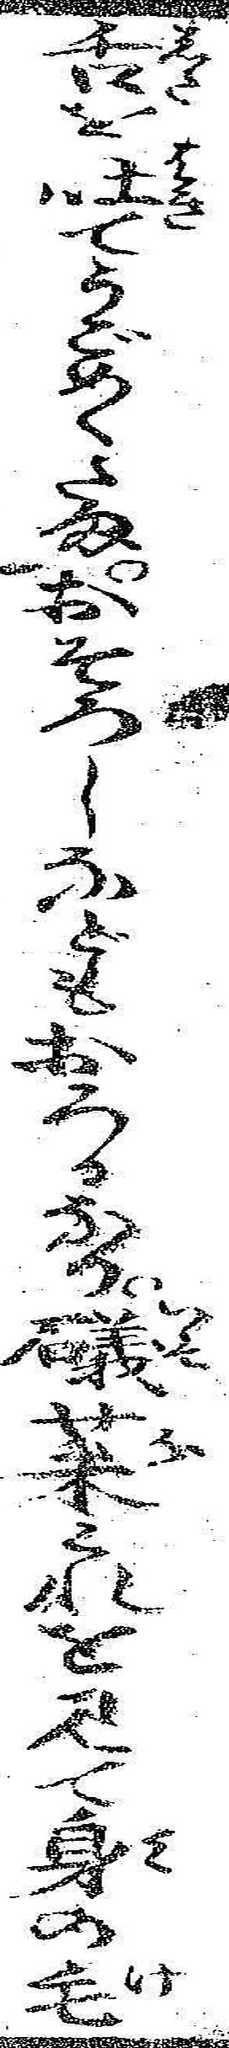舌を吐てうごめくさま。おそろしなどもおろかなり。礒菜これを見て身の毛
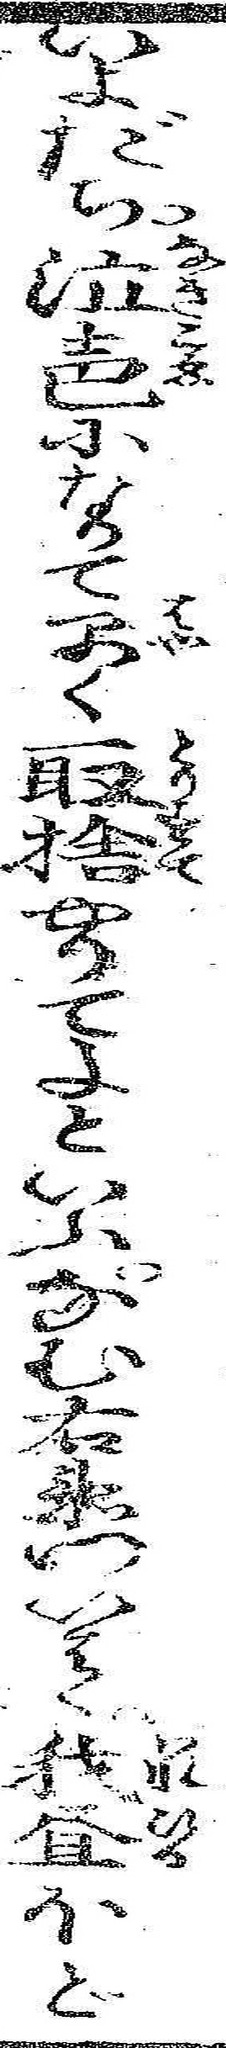いよだち。泣声になりて早く取捨やりてよといふ。なむ右衛門いはて。我昼ほど
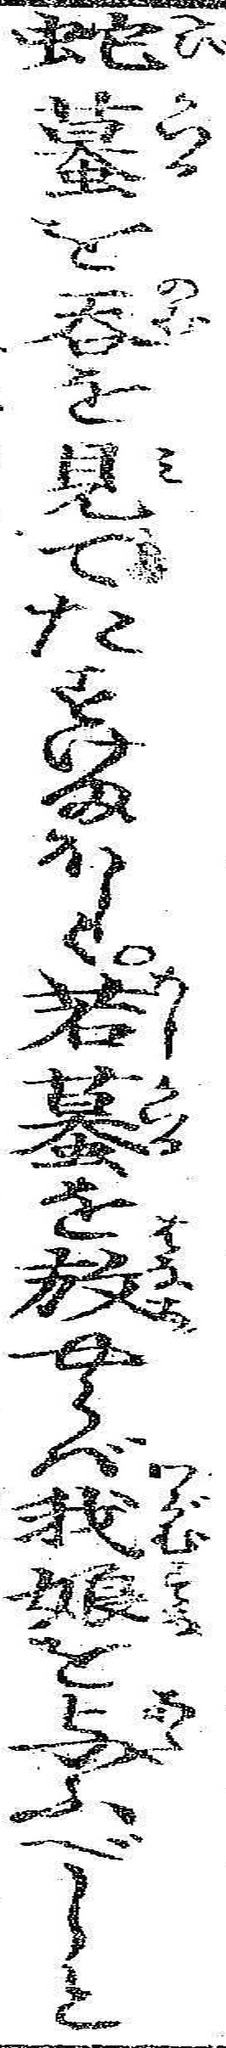蛇蟇を呑を見てたすけまほしく。若蟇を放やらば我娘を与ふべしと
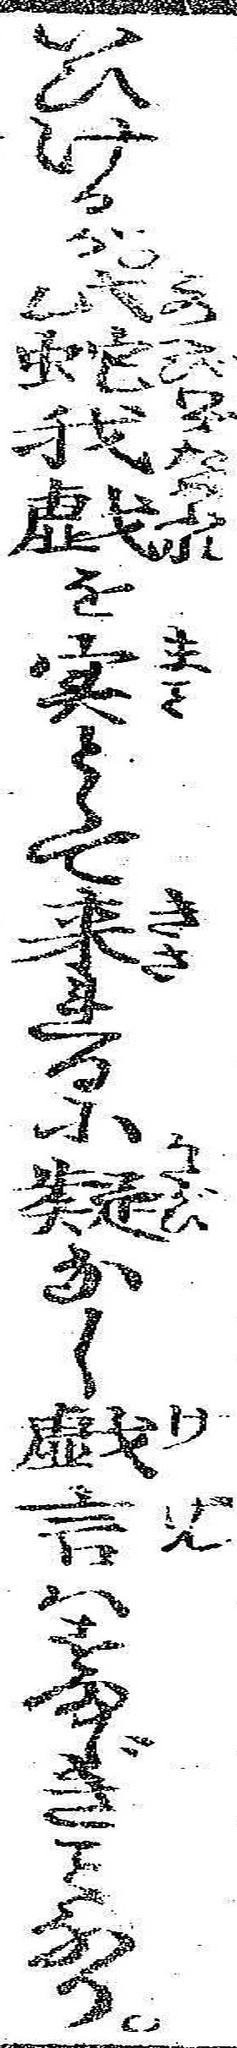いひけるが。此蛇我戯を実として来れるに疑なし戯言はすまじきことなり。
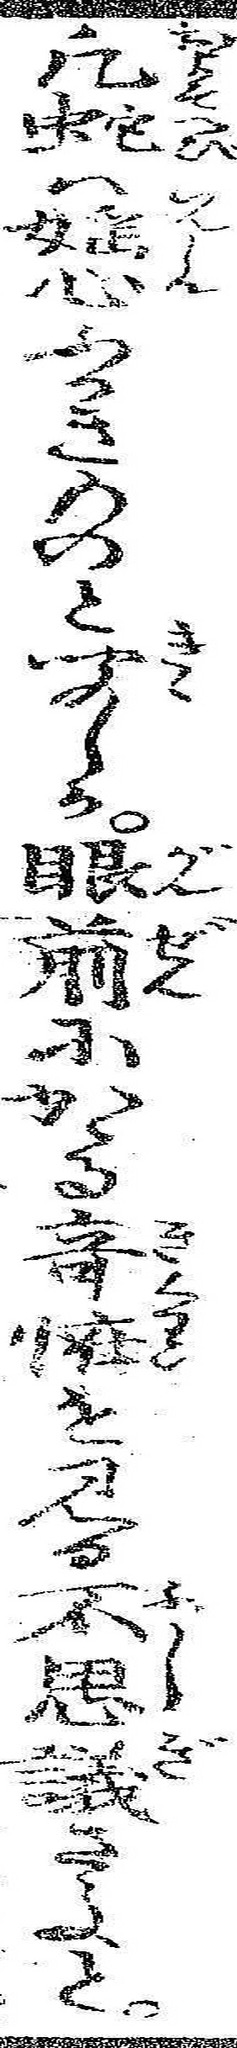凡蛇は婬心ふかきものと聞しか。眼前にかゝる奇恠を見る不思議さよと。
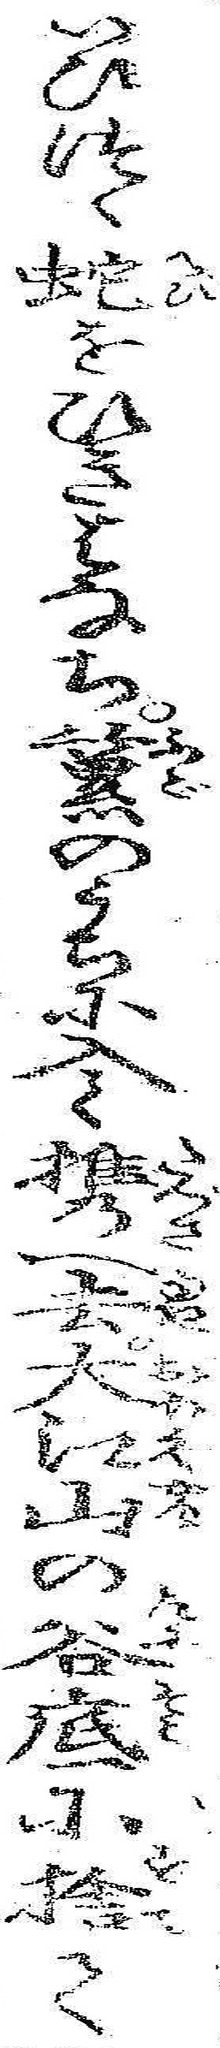いひつゝ蛇をひきはなち。䉂のうちに入て携へ去。大江山の谷底に捨て
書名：昔話稲妻表紙
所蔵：国文学研究資料館
